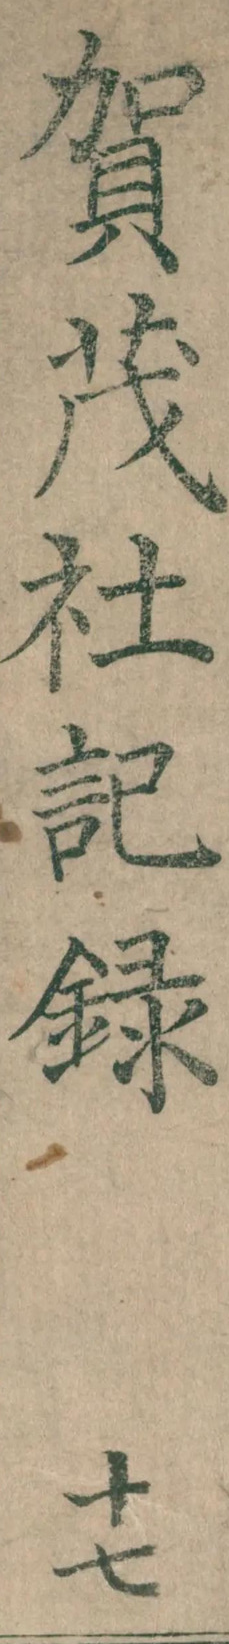賀茂社記録十七

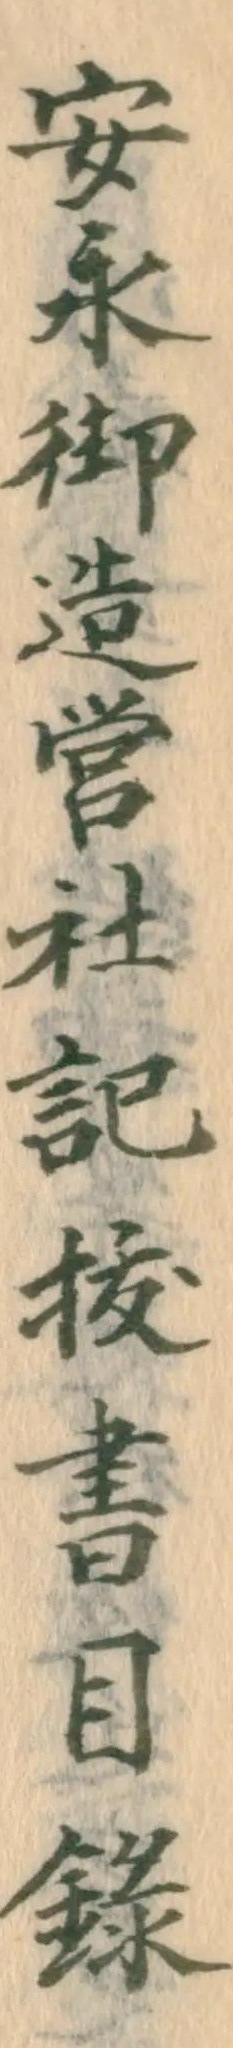安永御造営社記抜書目録
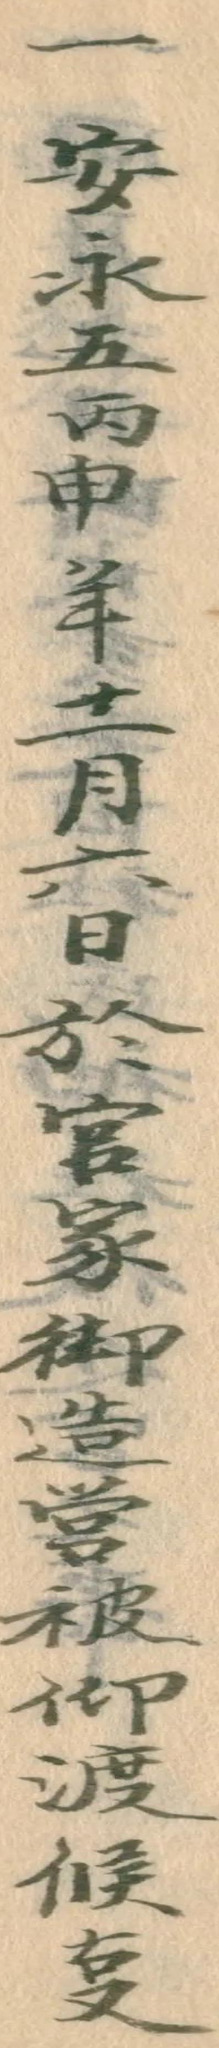一安永五丙申年十一月六日於宮家御造営被仰渡候事
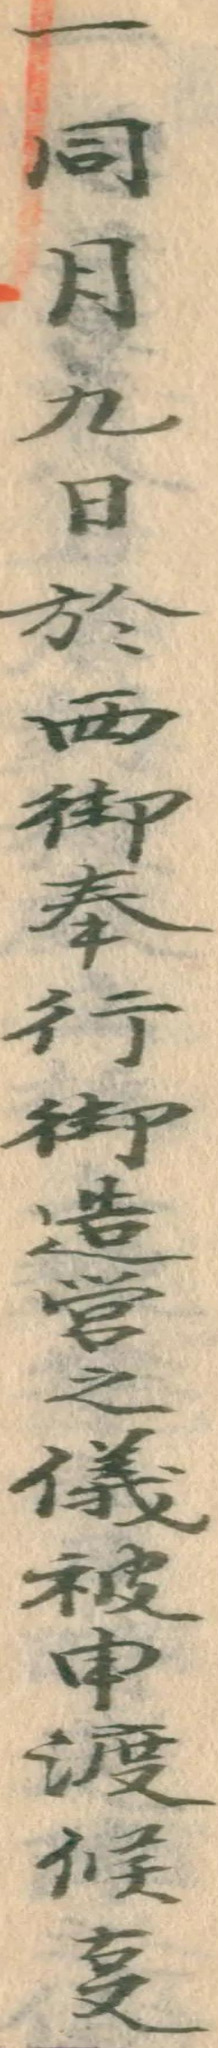一同月九日於西御奉行御造営之儀被申渡候事
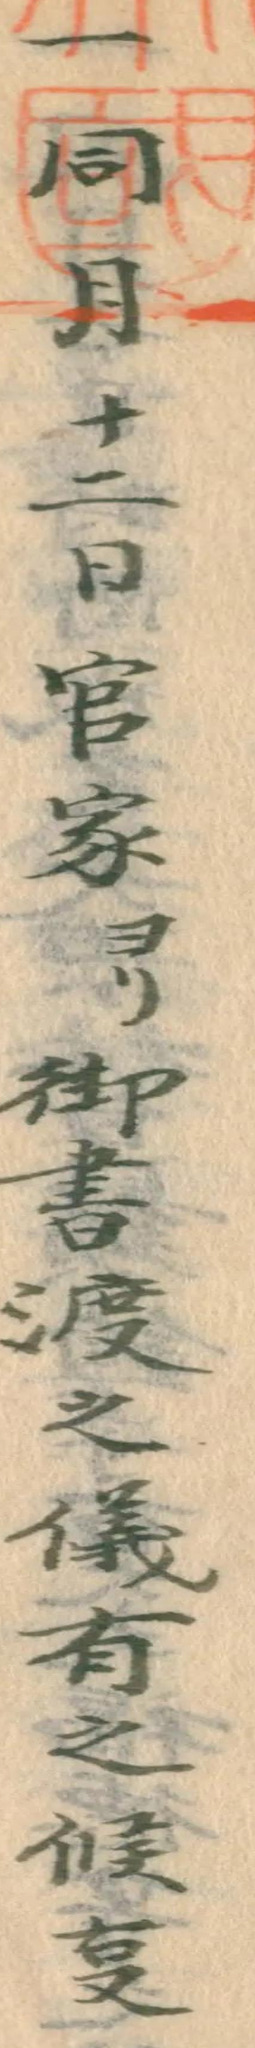一同月十二日官家ヨリ御書渡之儀有之候事
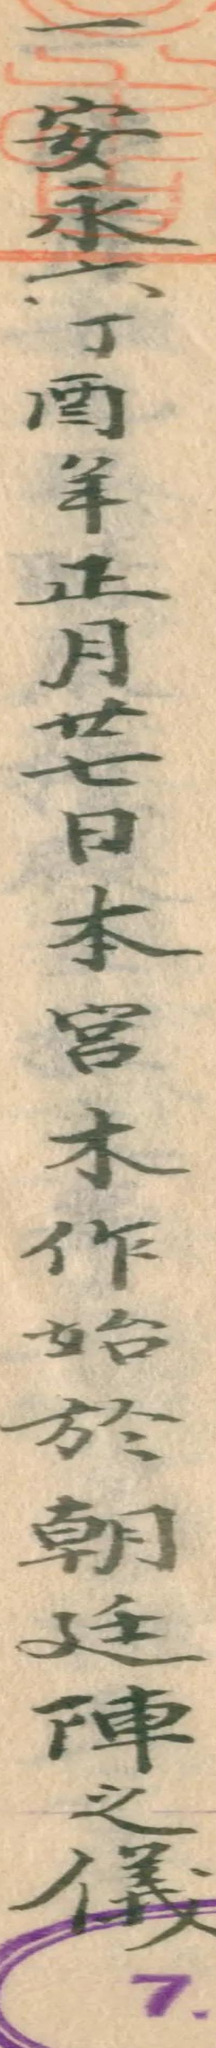一安永六丁酉年正月廿七日本宮木作始於朝廷陣之儀
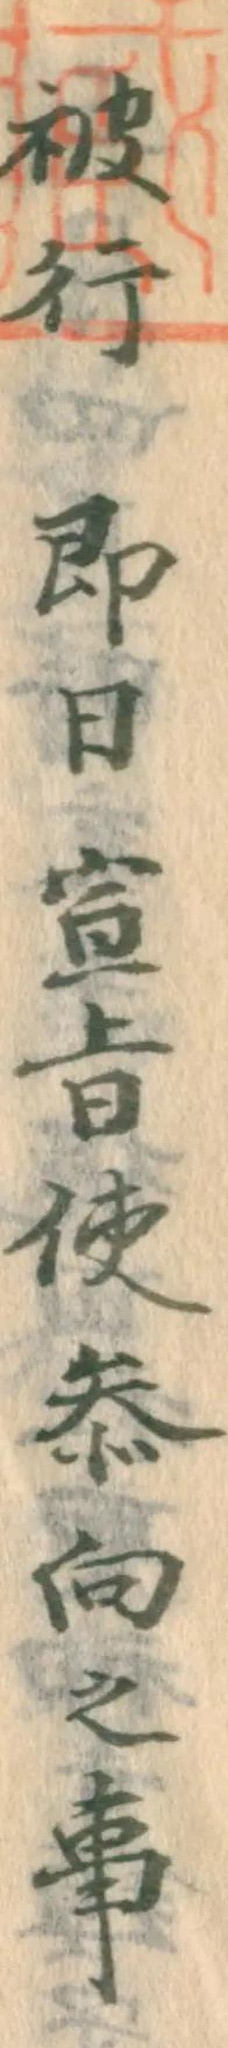被行即日宣旨使参向之事
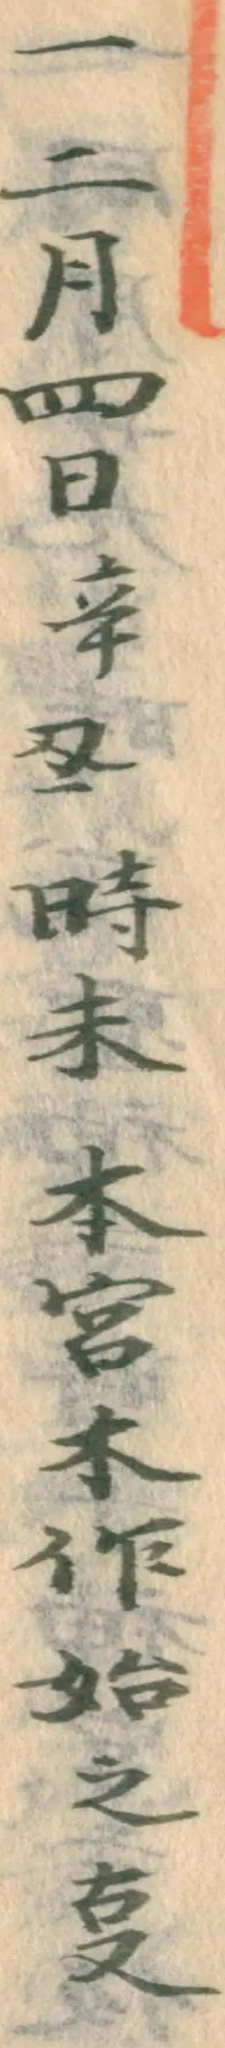一二月四日辛丑時未本宮木作始之事
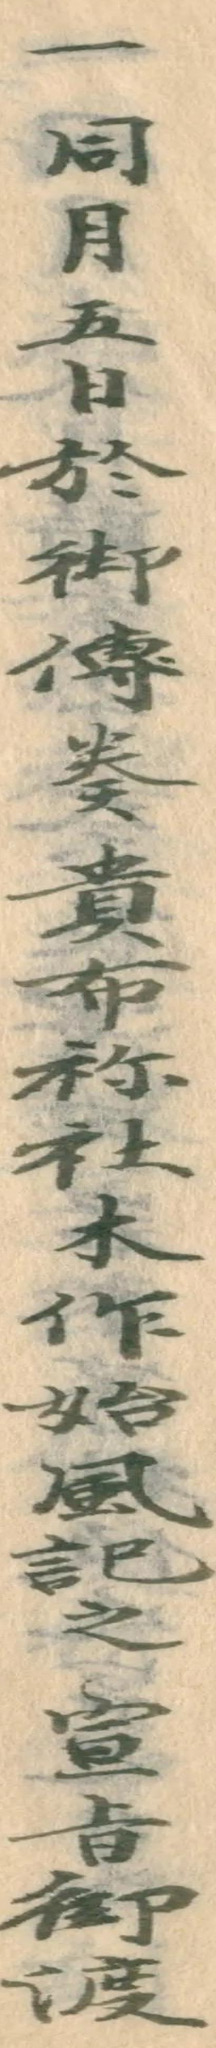一同月五日於御伝奏貴布祢社木作始風記之宣旨御渡
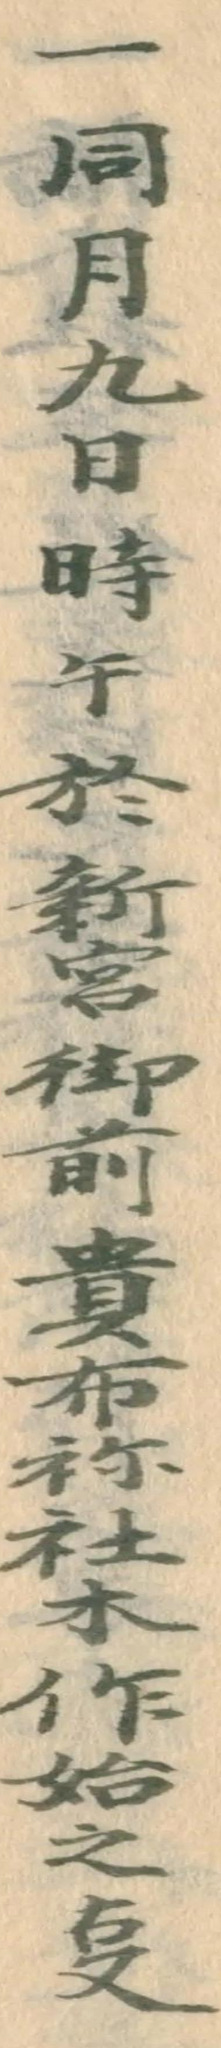一同月九日時午於新宮御前貴布祢社木作始之事
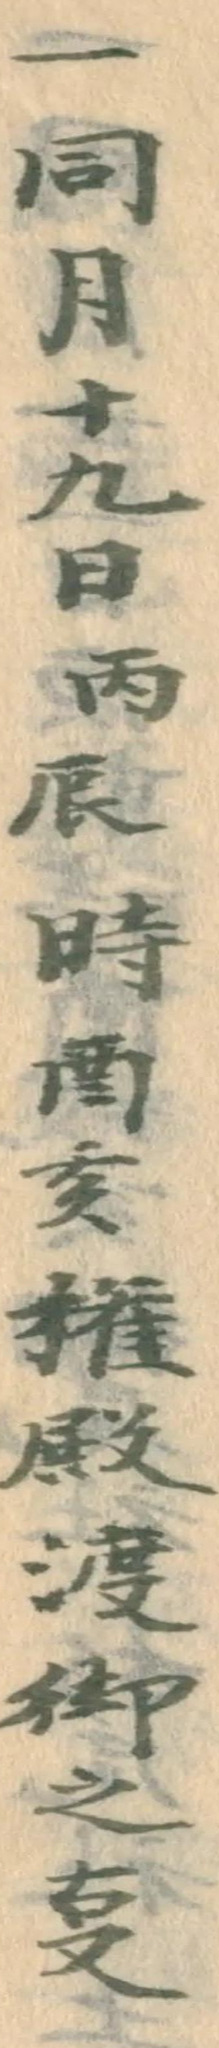一同月十九日丙辰時酉亥権殿渡御之事

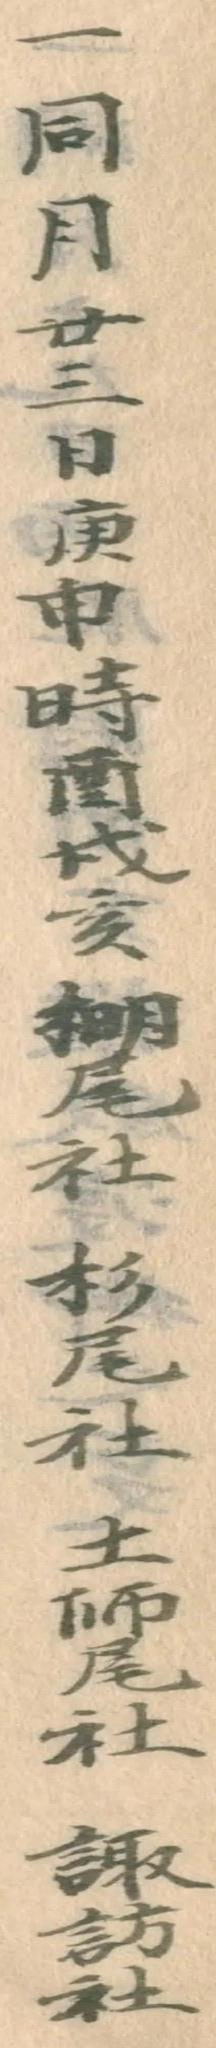一同月廿三日庚申時酉戌亥棚尾社杉尾社土師尾社諏訪社
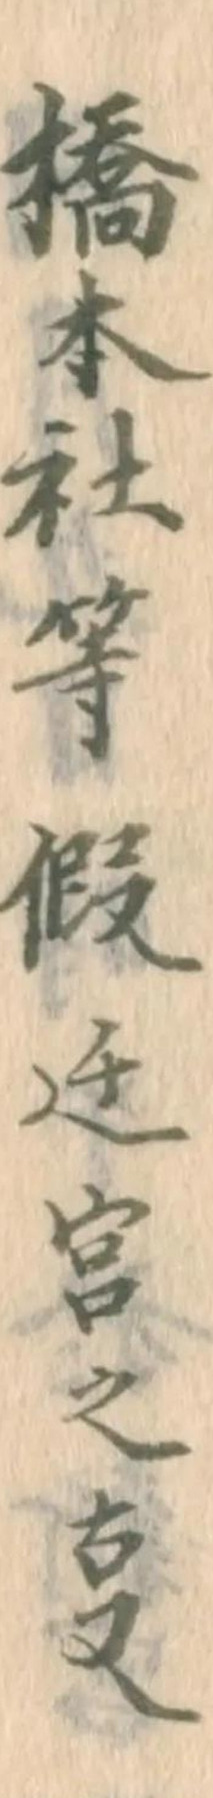橋本社等仮迁宮之事
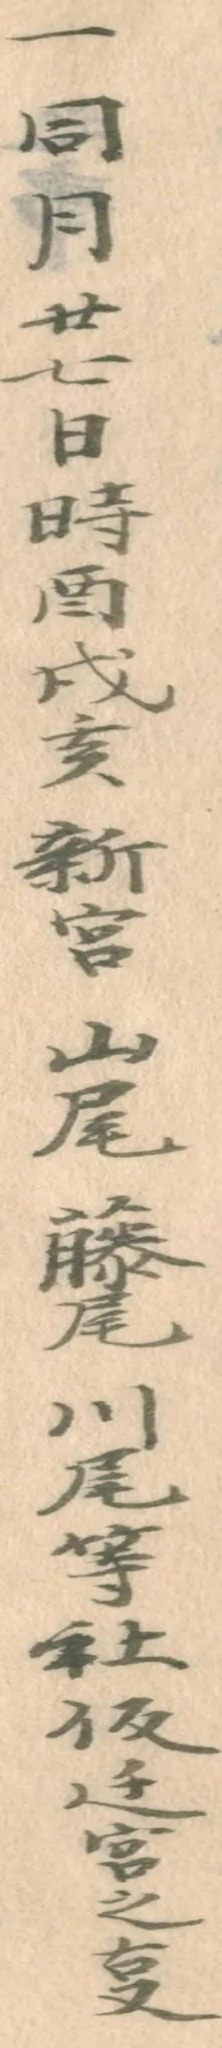一同月廿七日時酉戌亥新宮山尾藤尾川尾等社仮迁宮之事
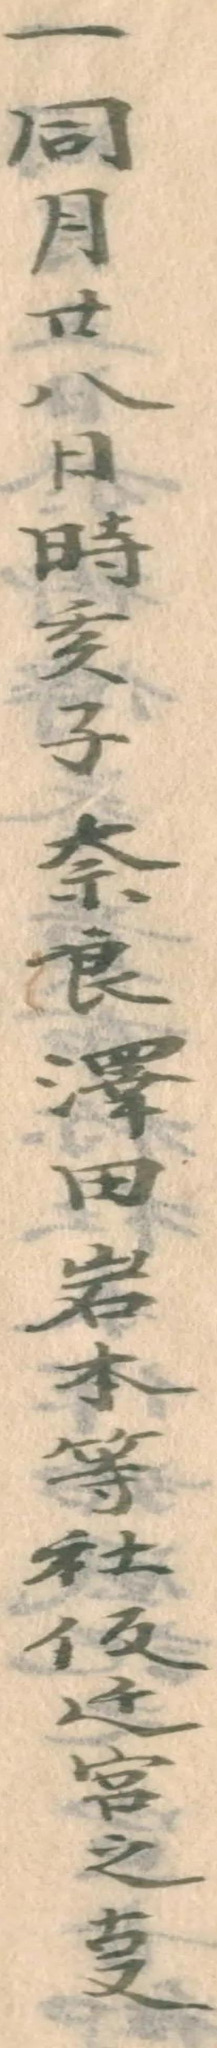一同月廿八日時亥子奈良澤田岩本等社仮迁宮之事
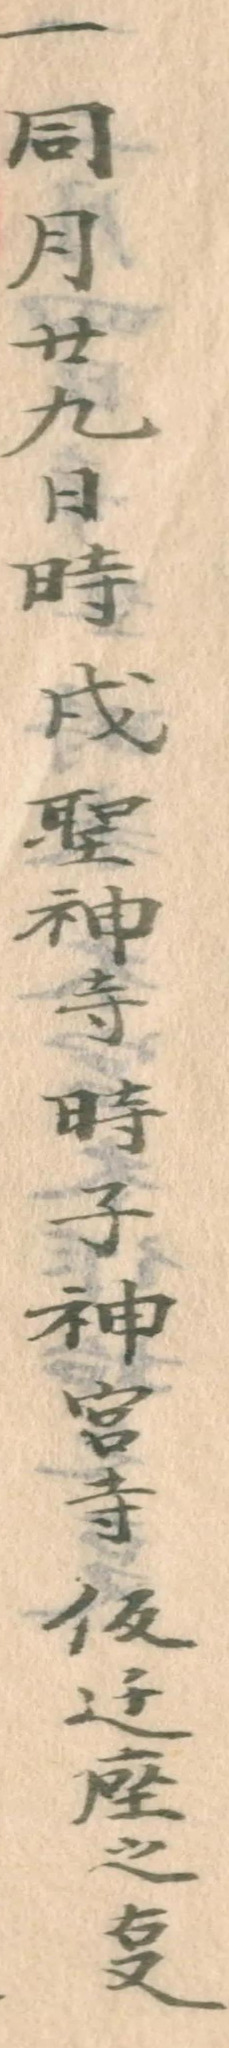一同月廿九日時戌聖神寺時子神宮寺仮迁座之事
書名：賀茂社記録. 第17冊
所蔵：国立国会図書館 National Diet Library, JAPAN
